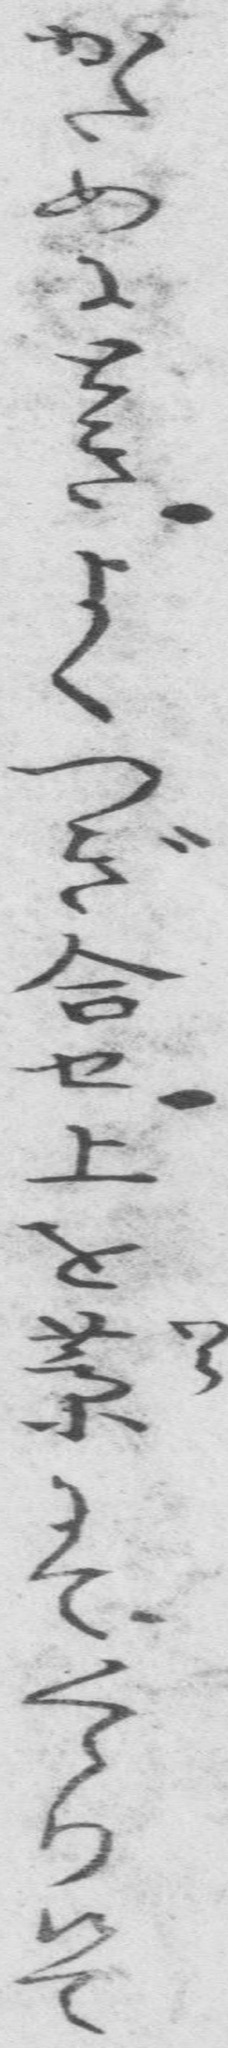かためにとき。よくつぎ合せ。上を藁にて。くゝり候て
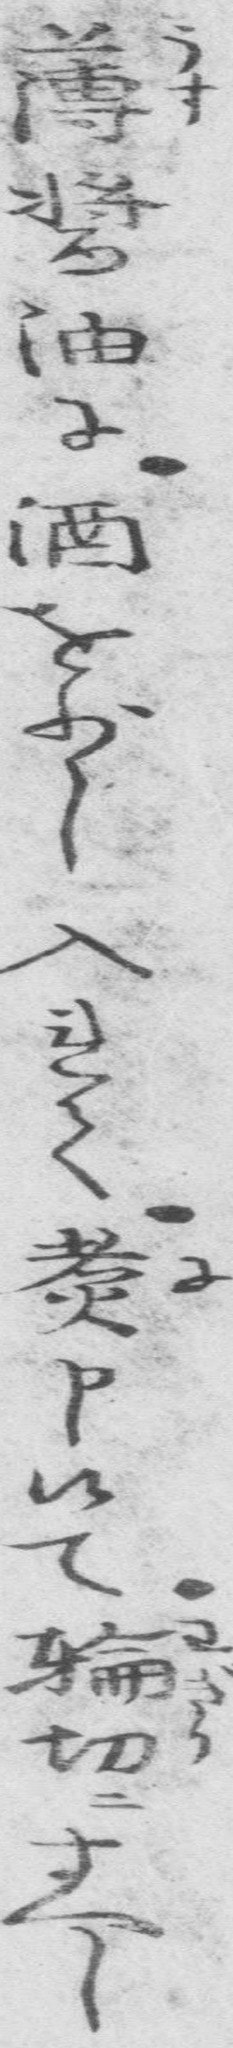薄醤油に。酒を少し入れて。煮申候て。輪切にすへし
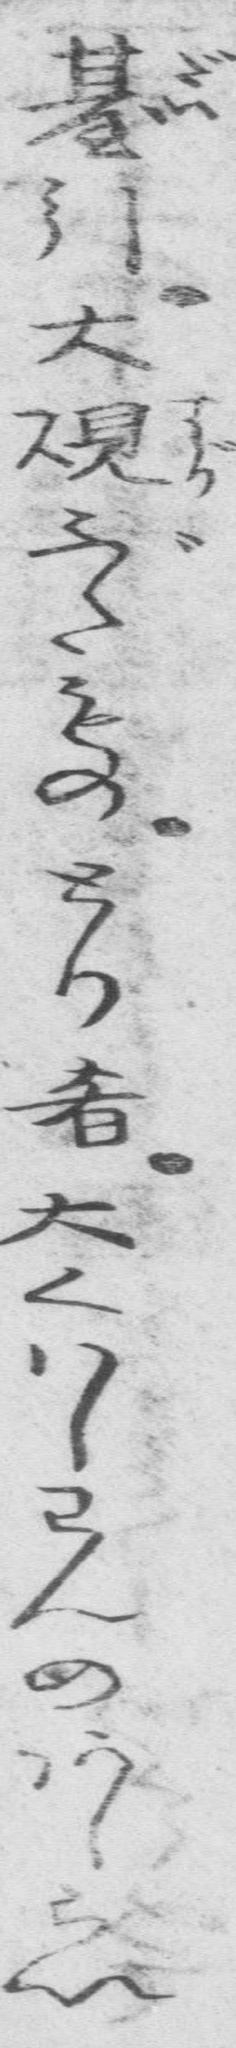台引。大硯ふたもの。とり肴。大くはしわんのあしらい
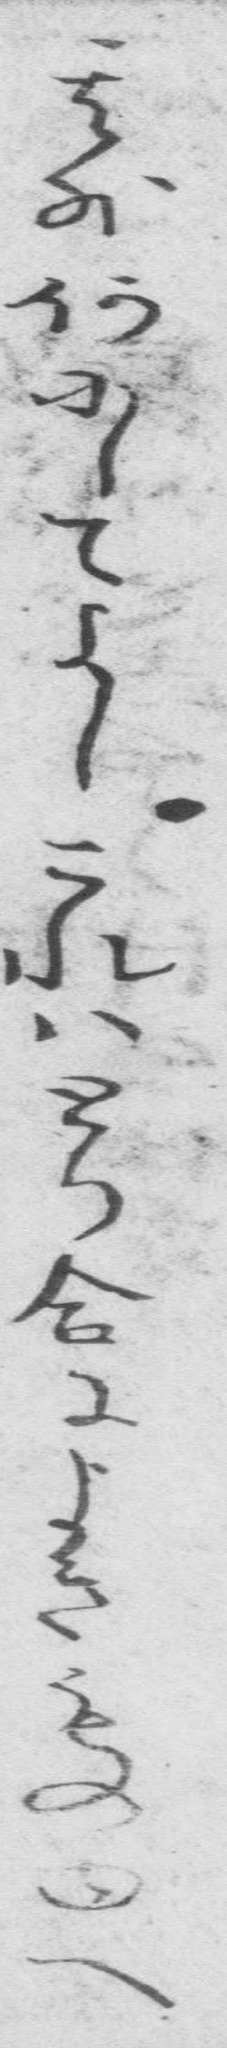其外何にしてよし。これはとり合によきものゆへ
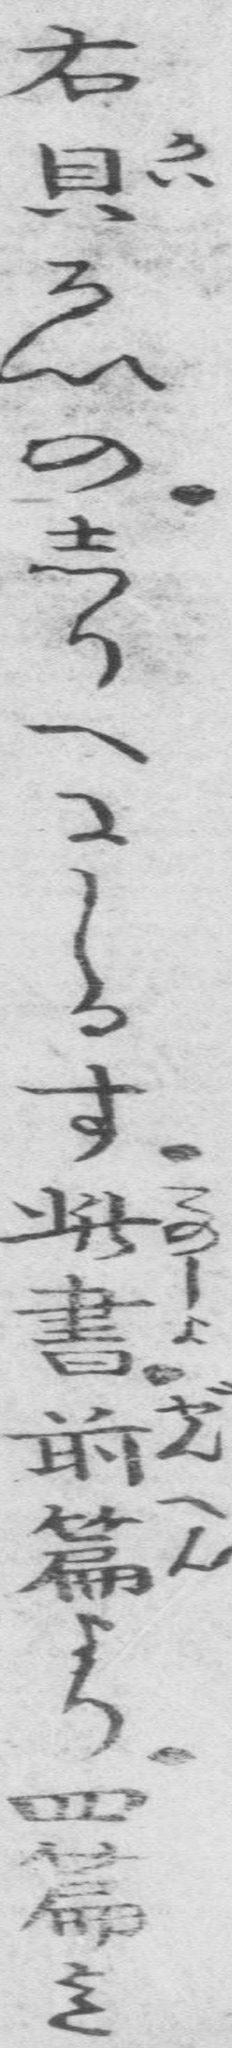右貝るいの。しりへにしるす。此書。前篇より。四篇迄
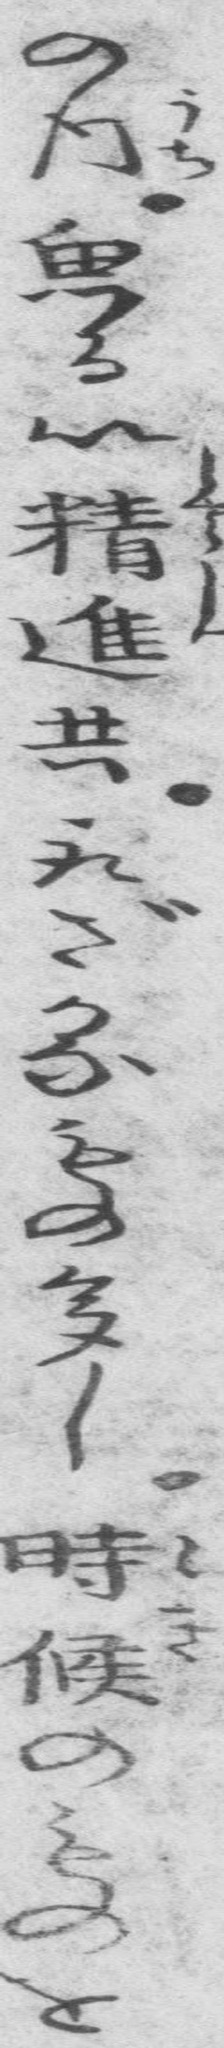の内。魚るい精進共。取ざかなもの多し。時候のものを

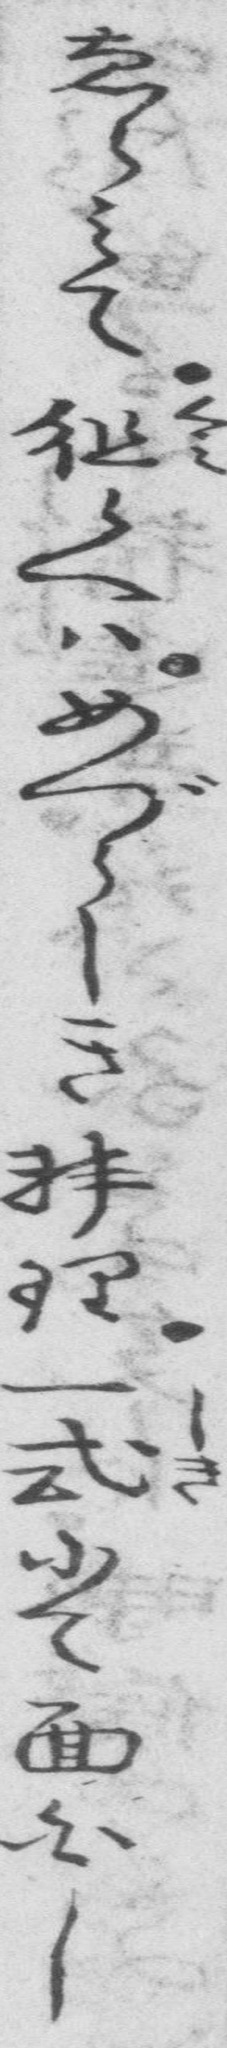ゑらみて。組候へは。めづらしき料理。一式にて面白し
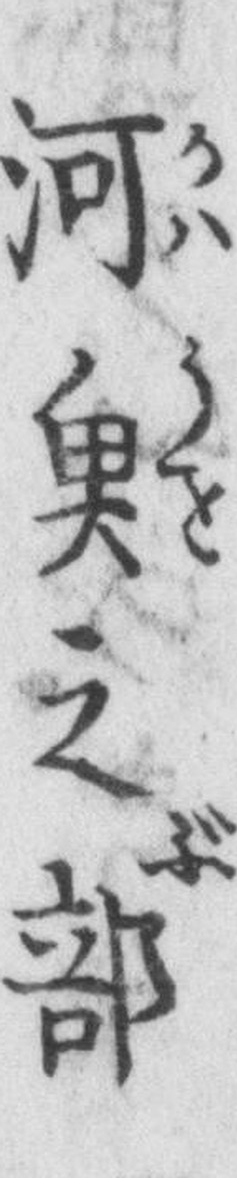河魚之部
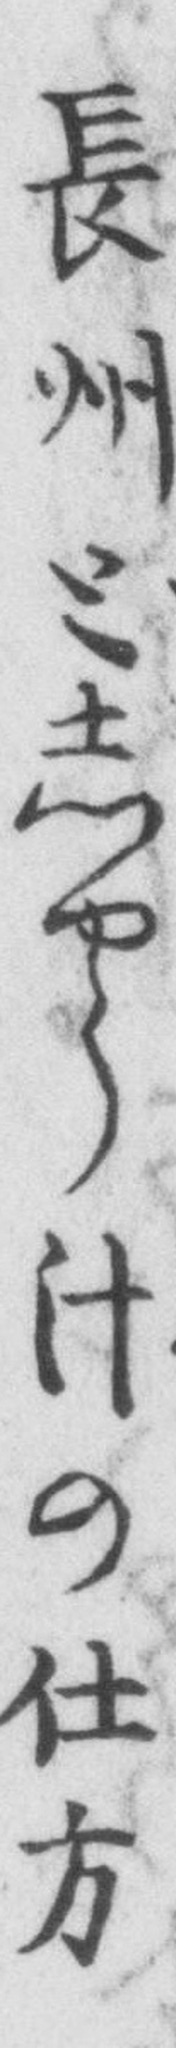長州どじやう汁の仕方
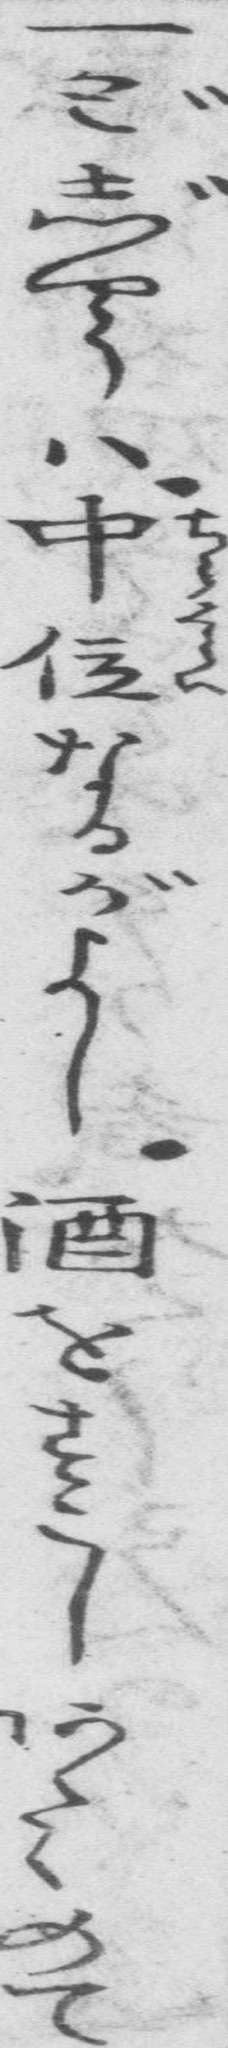一どじやうは。中位なるがよし。酒をすこしあたゝめて
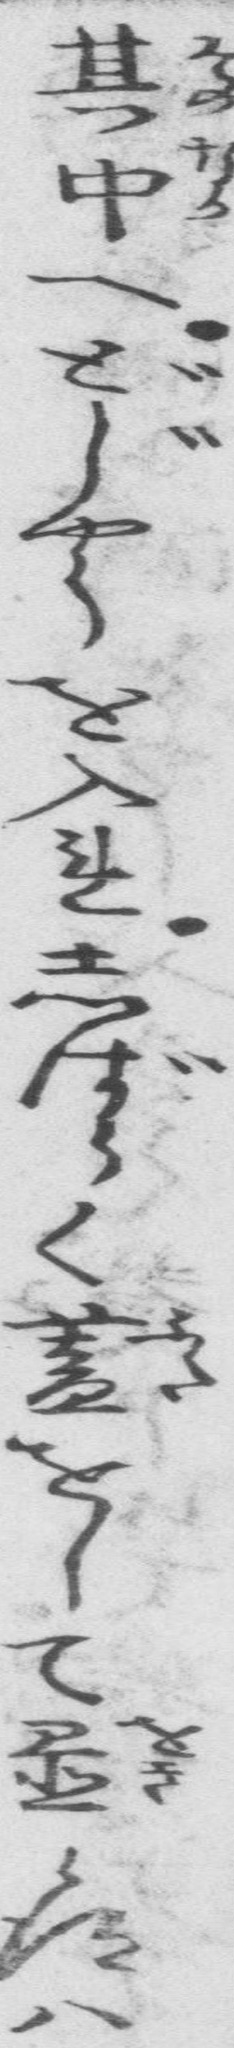其中へ。どじやうを入れ。しばらく蓋をして置候得は
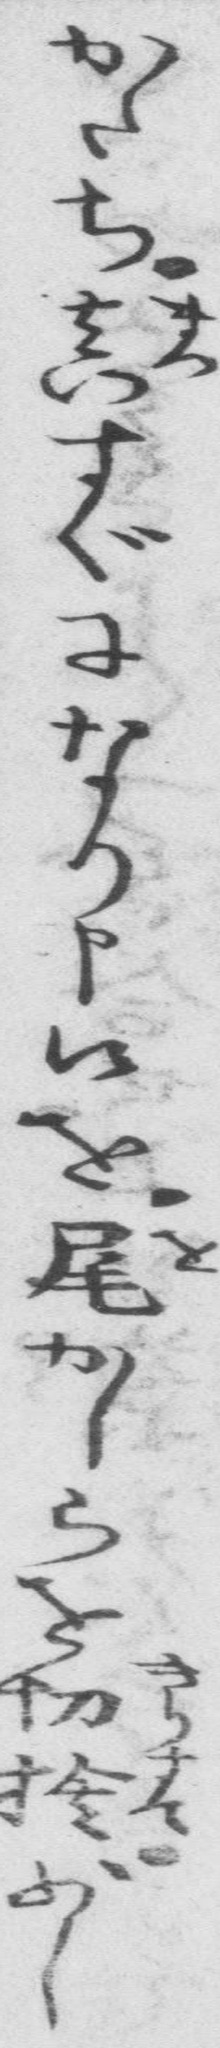かたち。真すぐになり申候を。尾かしらを切捨。少し
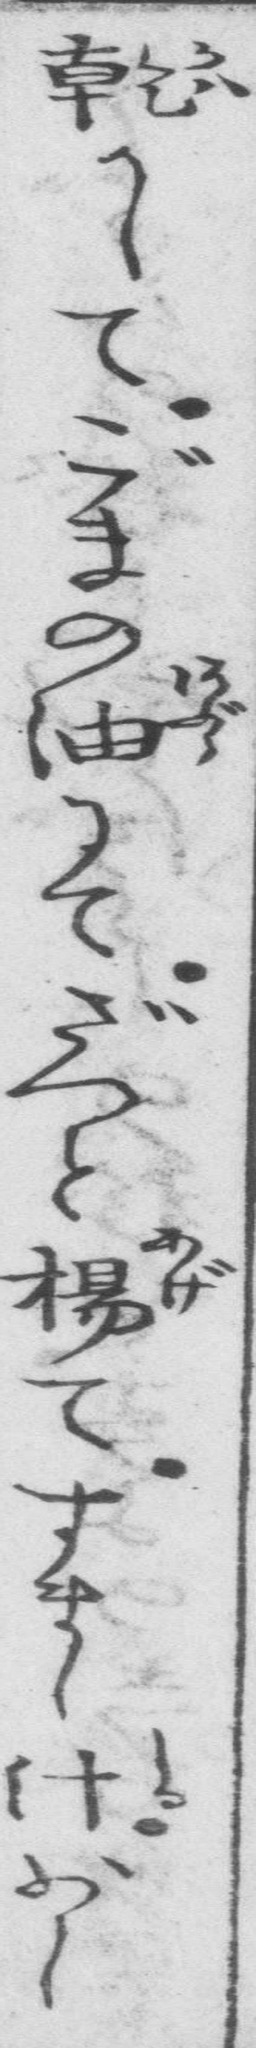乾かして。ごまの油にて。ざつと揚て。すまし汁。少し
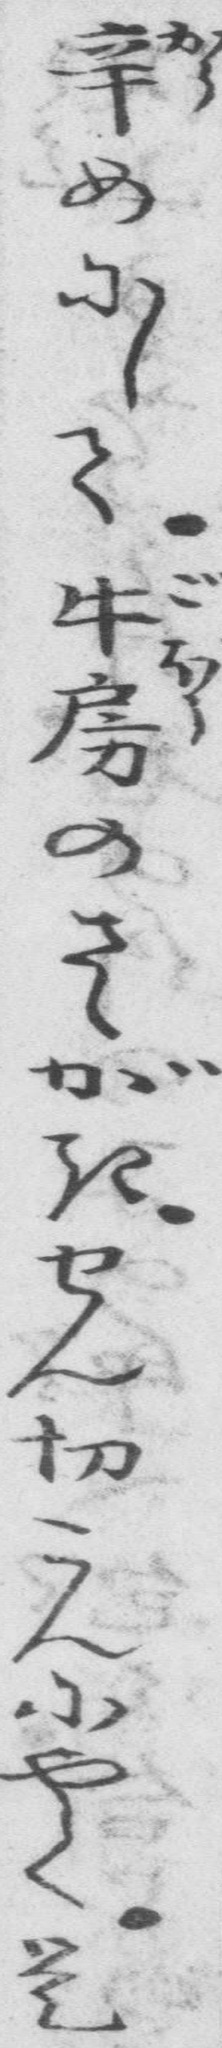辛めにして。牛房のさゝがき。せん切こんにやく。是
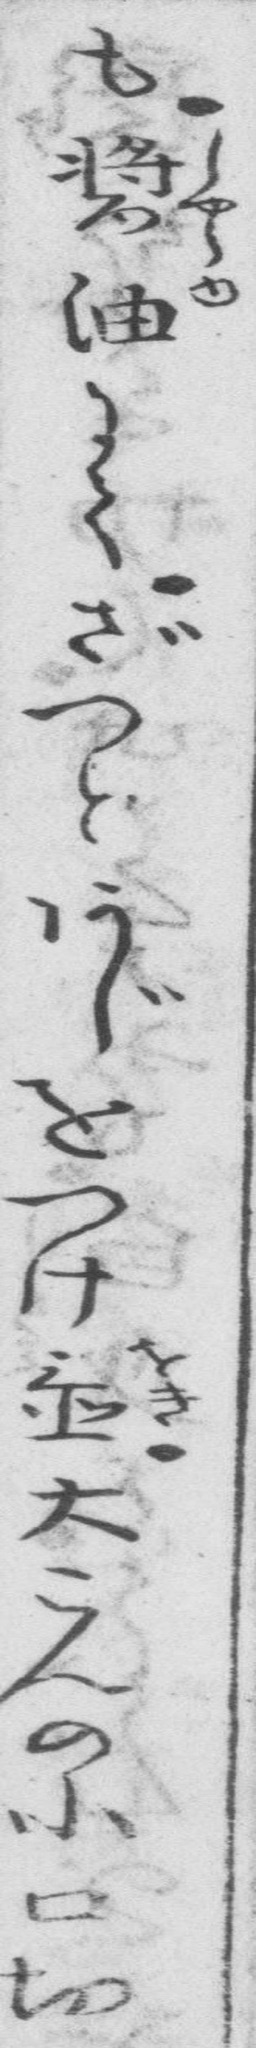も。醤油にて。ざつとあじをつけ置。大こんの小口切
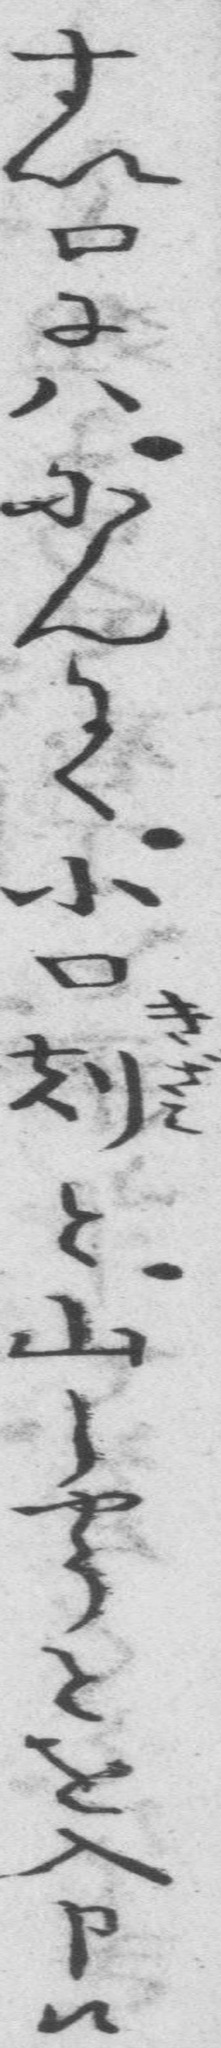すい口には。にんにく。小口刻と。山しやうとを入申候
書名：萬寳料理秘密箱
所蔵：大阪府立大学学術情報センター 国文学研究資料館
